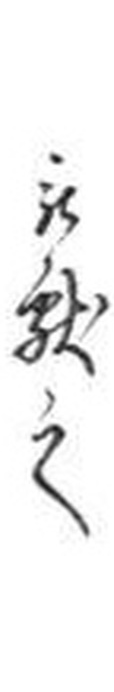被献之
